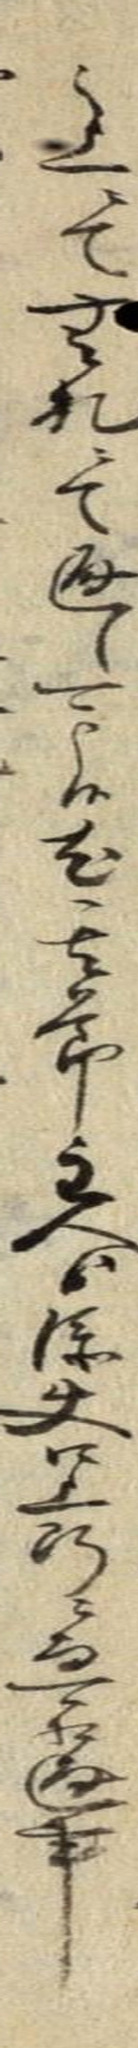之上にて無札にて通し可申候尤其節主人ゟ添使口上断にて可相通事
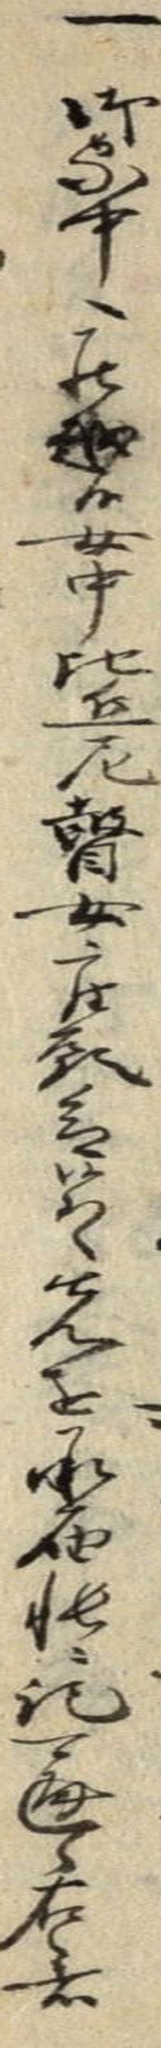一御家中へ罷越候女中比丘尼瞽女座頭参候はゝ先を承届帳に記可通候右之者
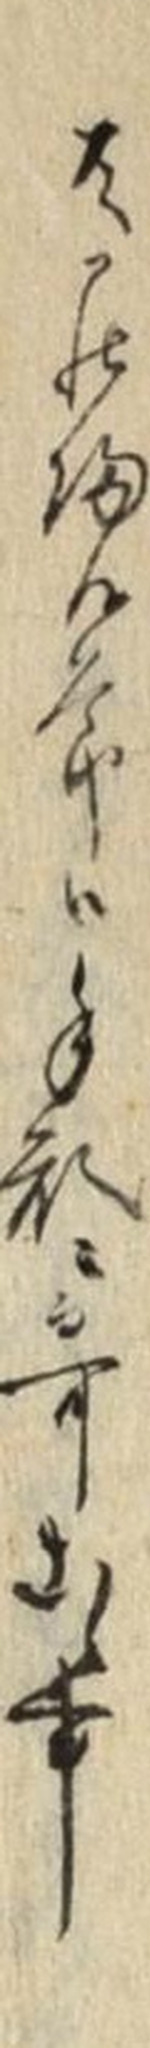共罷帰候節は手形にて可出候事
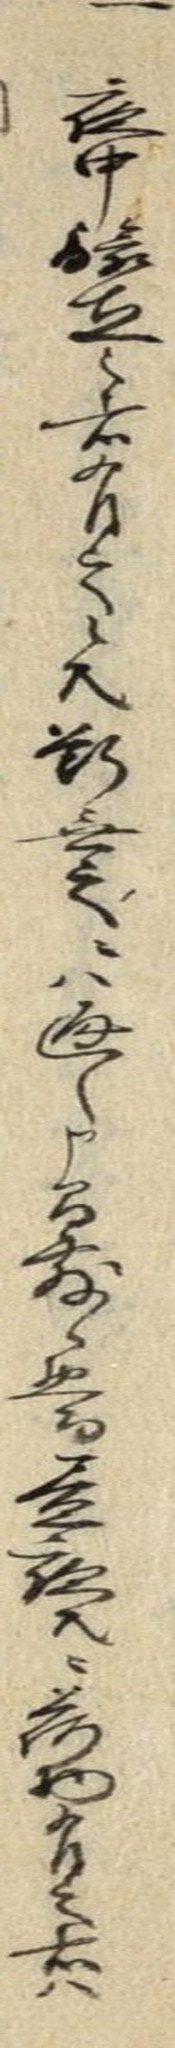一夜中旅立之者有之候共断無之候は通し申間敷候惣て昼夜共に荷物有之者は
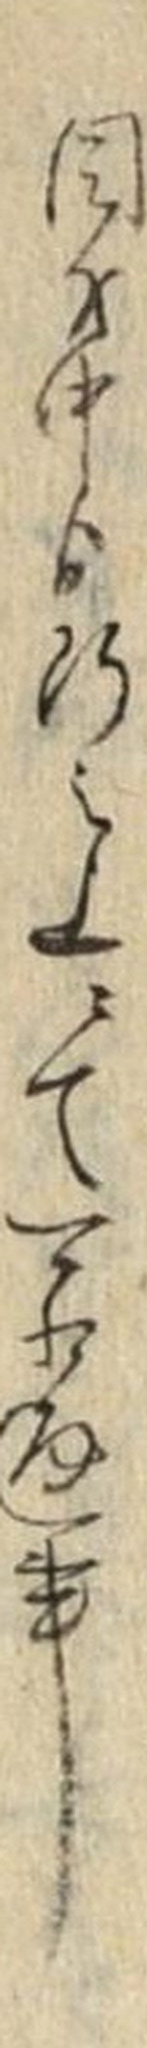目付中ゟ断之上にて可相通事
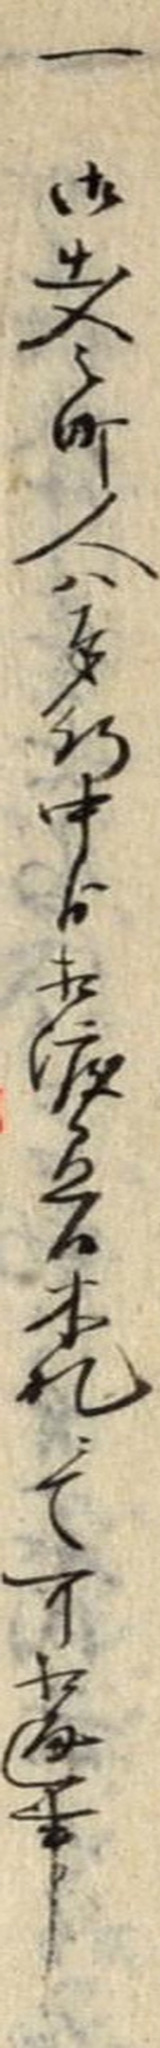一御出入之町人は奉行中ゟ相渡置候木札にて可相通事
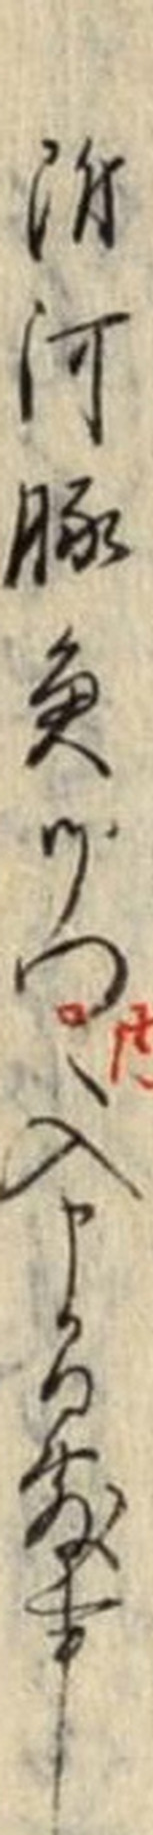附河豚魚御門へ入申間敷事
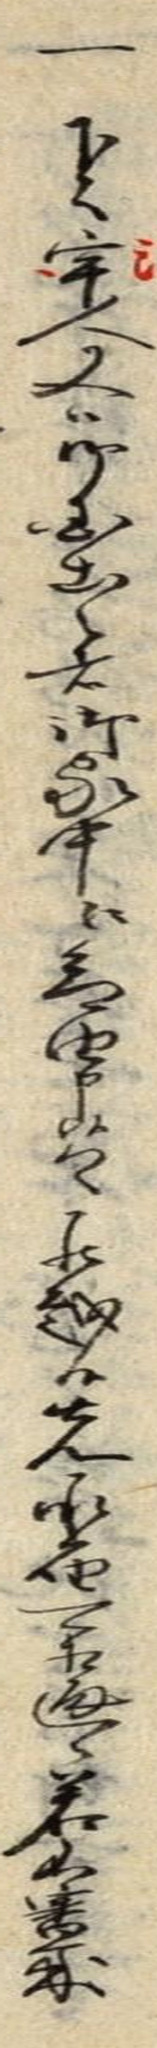一下々牢人又は御国出之者御家中へ参由申候はゝ罷越候先承届可相通候若不審成
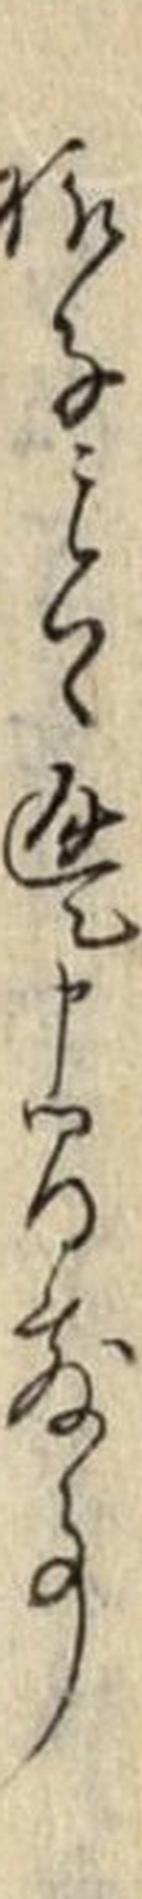様子に候はゝ通し申間敷事
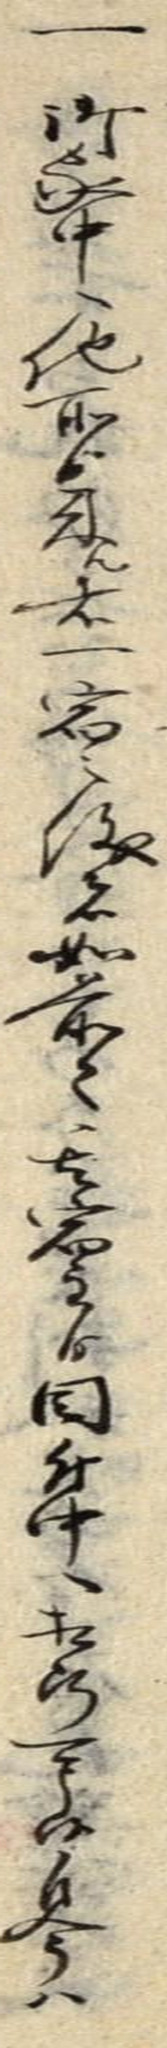一御家中へ他所ゟ来る者一宿之儀は如前々其宿主ゟ目付中へ相断可申候自今は
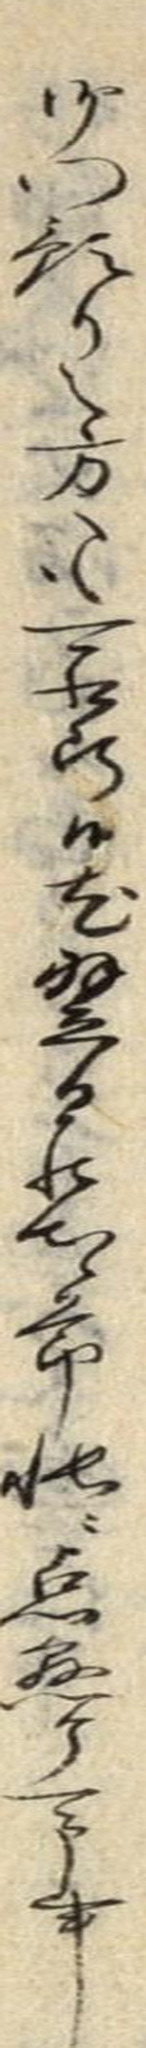御門預り之方へも可相断候尤翌日罷出候節帳に点懸け可申事
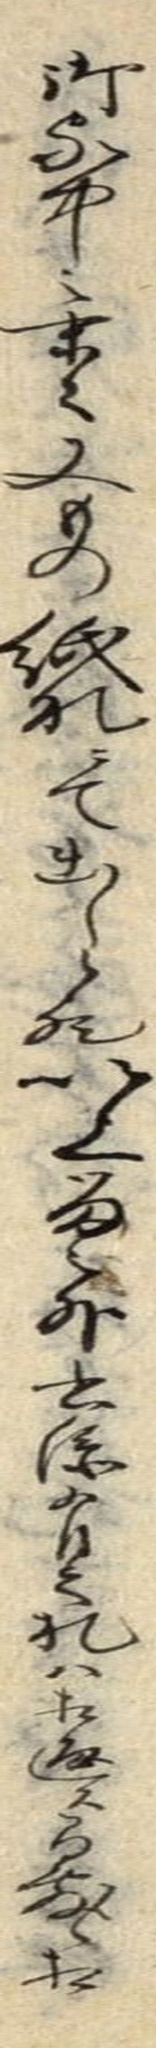一御家中之末々又もの紙札にて出候歟以上留之外書添有之札は相通す間敷候相
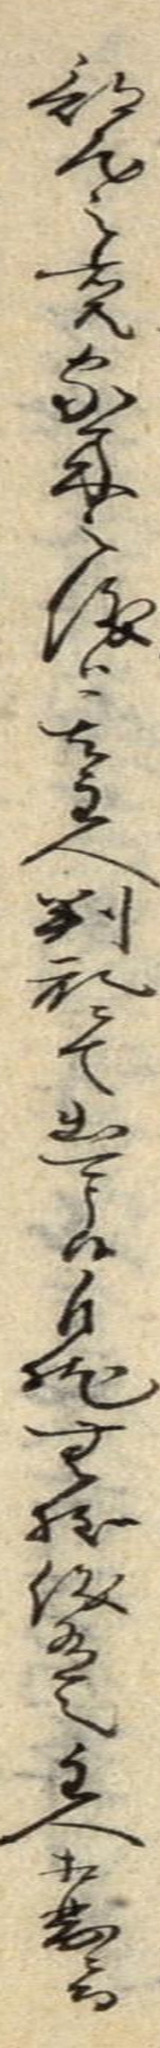部屋之者共家来之儀は其主人判形にて出可申候自然無據儀有之主人相対にて
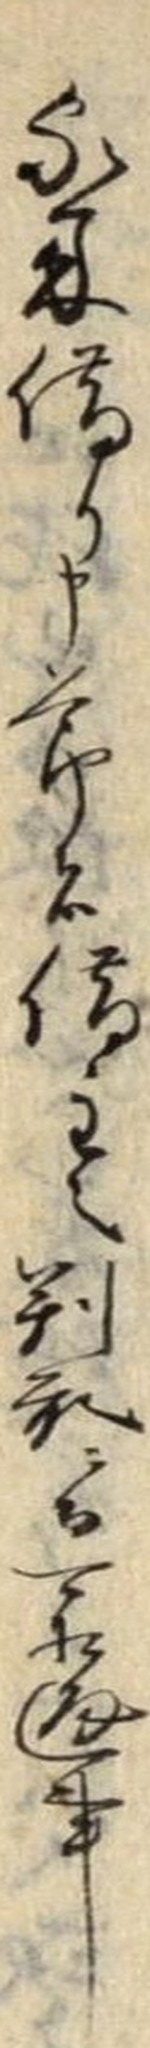家来借り申節は借主之判形にて可相通事

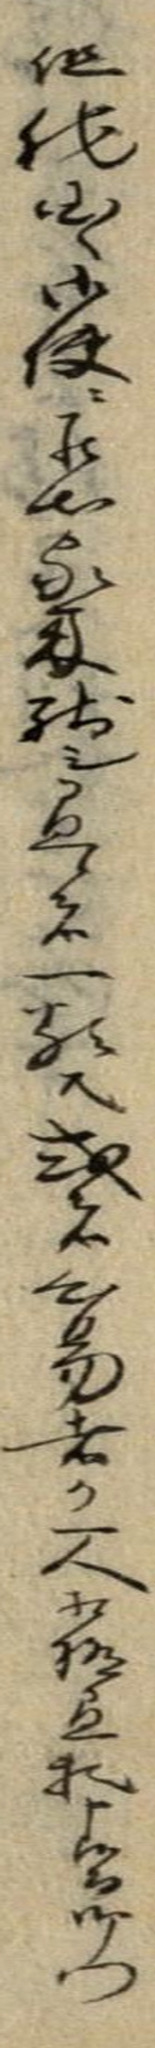但他国へ御使に罷出家来残し置候者一類共或は心易者の一人相極置頼申候て御門
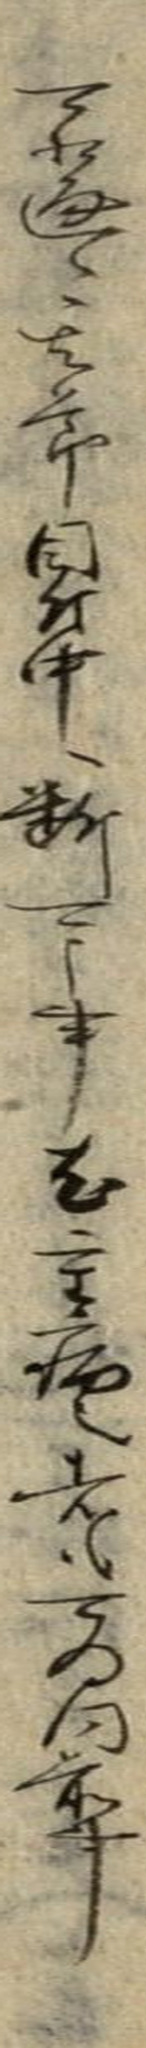可相通候其節目付中へ断可申事尤重病之者も可為同前事
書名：三都并道中之部
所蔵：福井県文書館 Fukui Prefectural Archives
